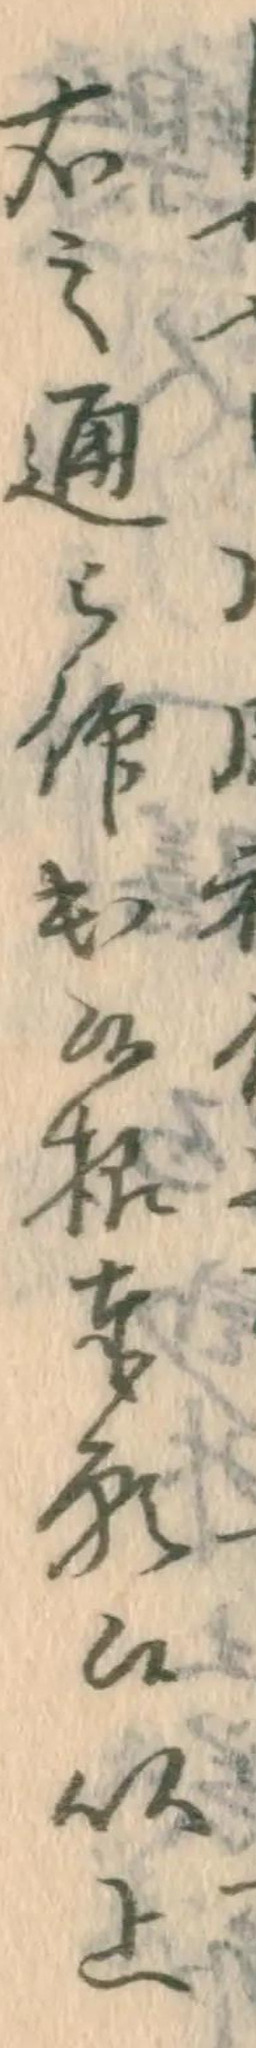右之通被仰出候様奉願候以上
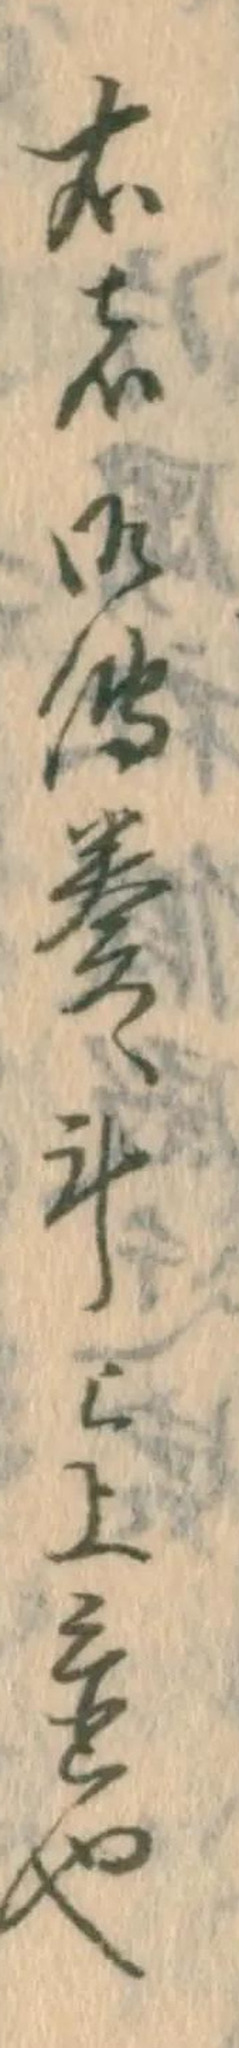右は御伝奏へ計被上置也
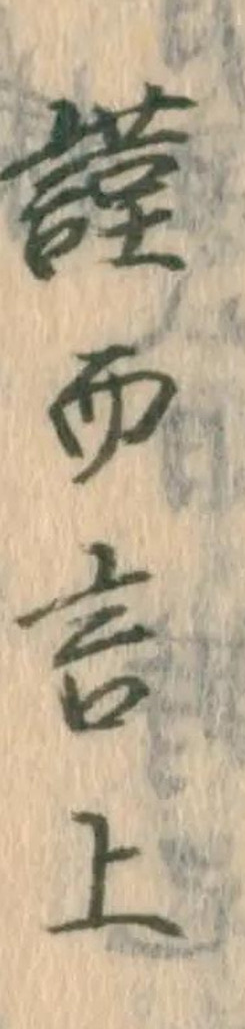謹而言上
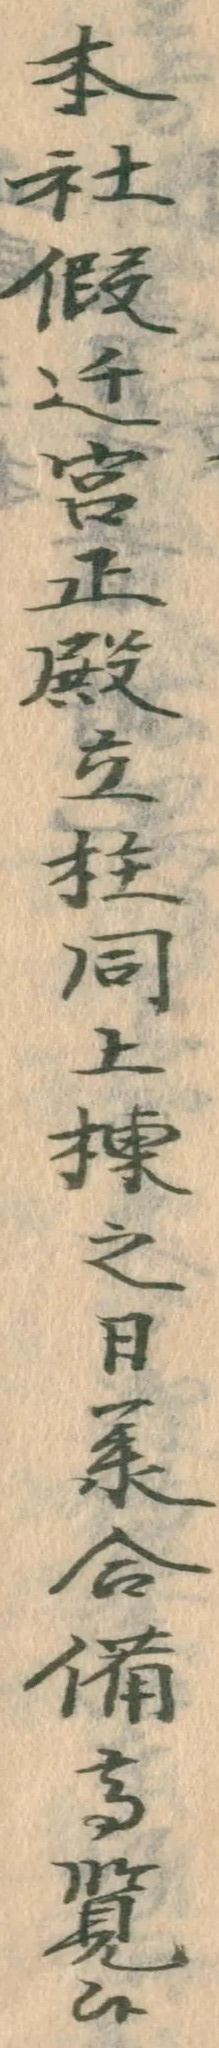本社仮迁宮正殿立柱同上棟之日承合備高覧候
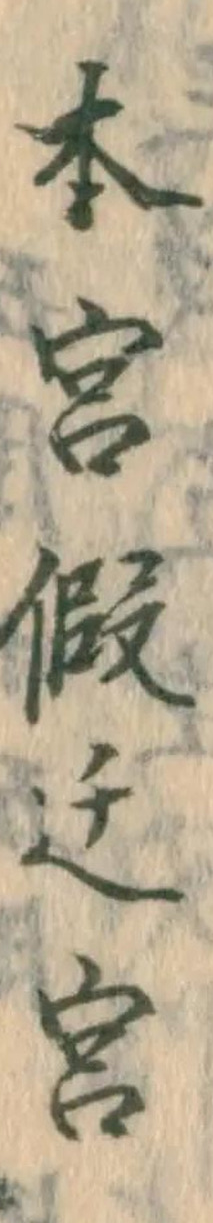本宮仮迁宮
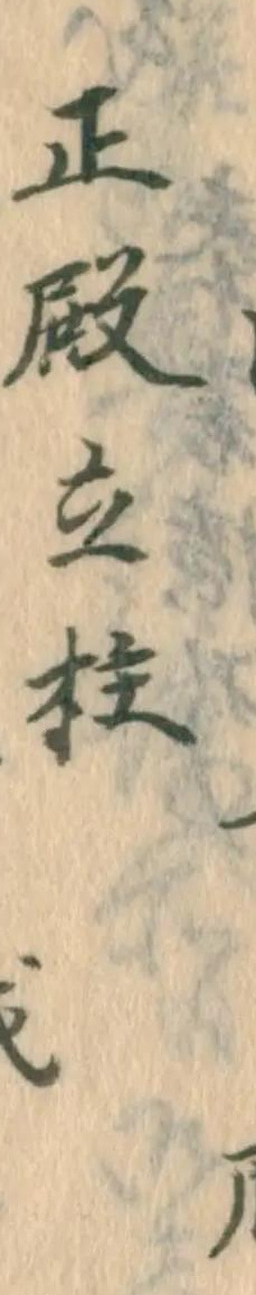正殿立柱
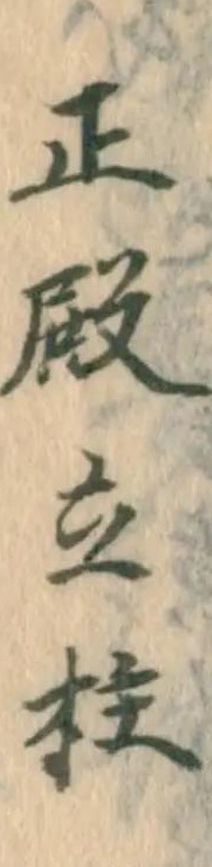正殿立柱
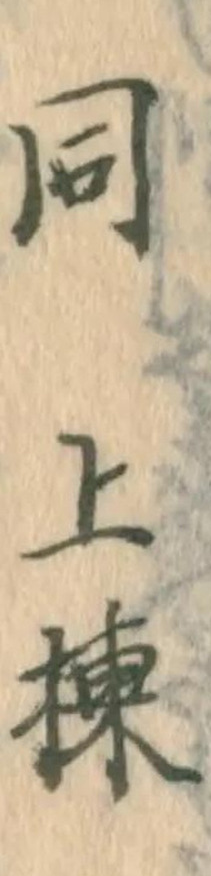同上棟
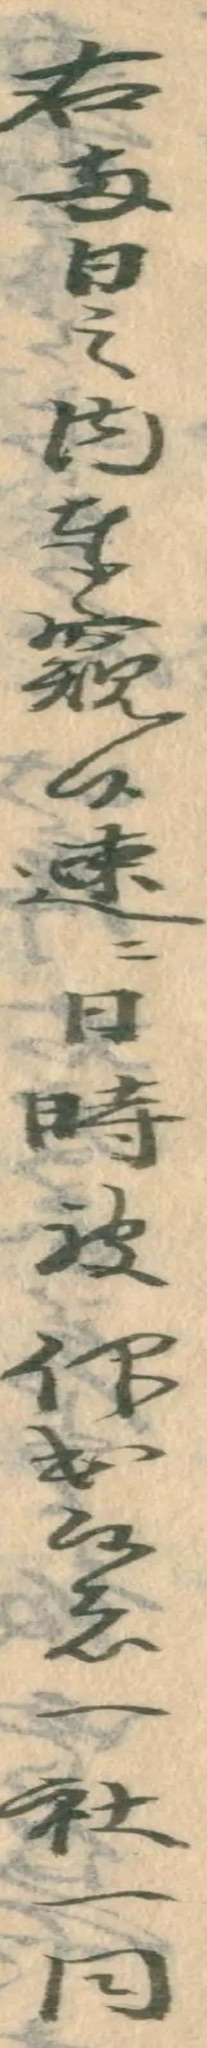右両日之内奉窺候速ニ日時被仰出候は一社一同
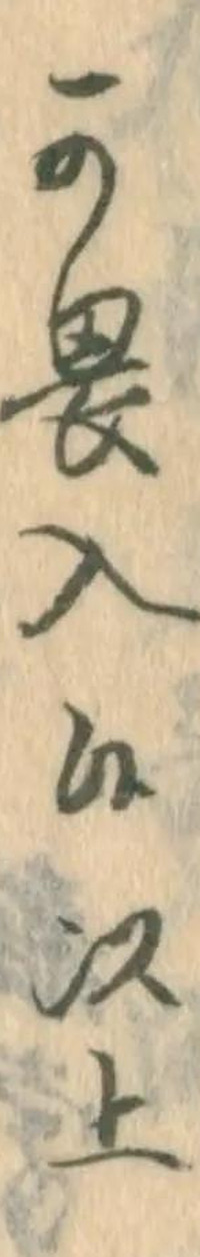可畏入候以上
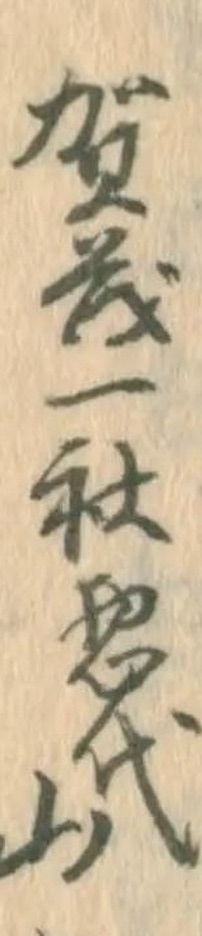賀茂一社惣代

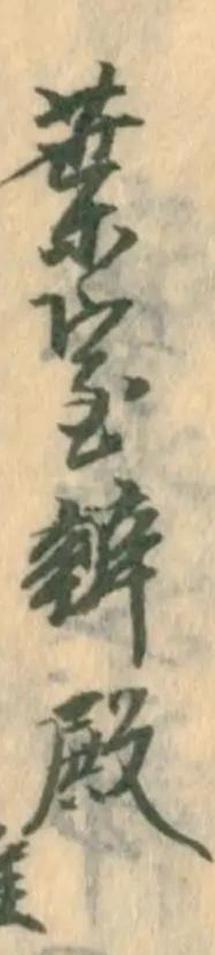葉室弁殿
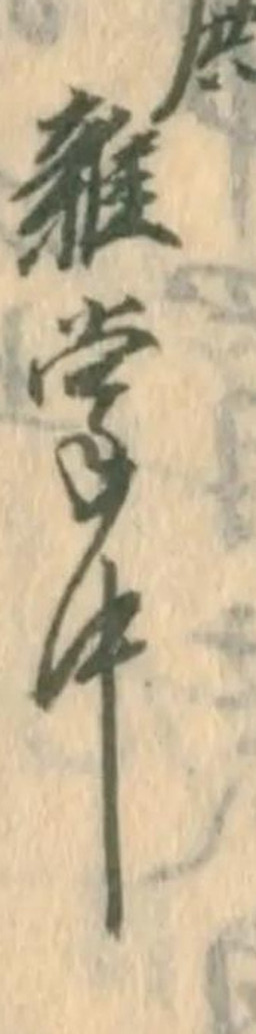雑掌中
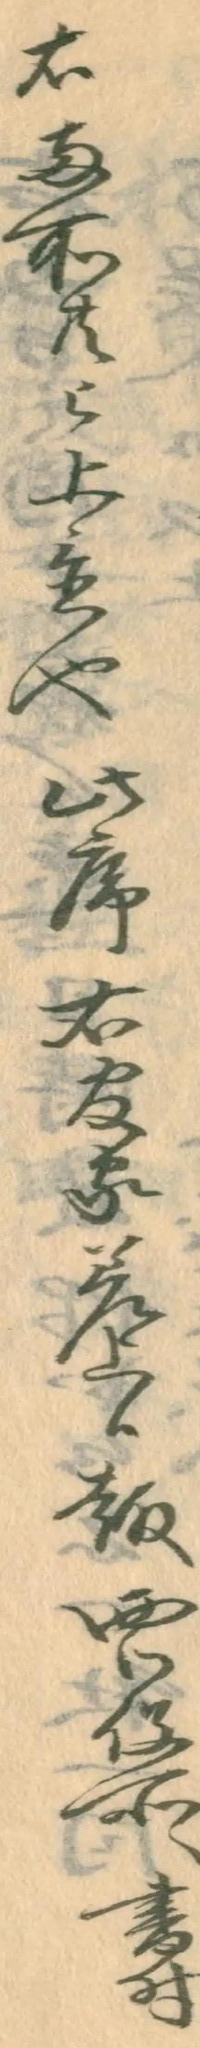右両所共被上置也此序右官家差上候趣西御役所へ書付
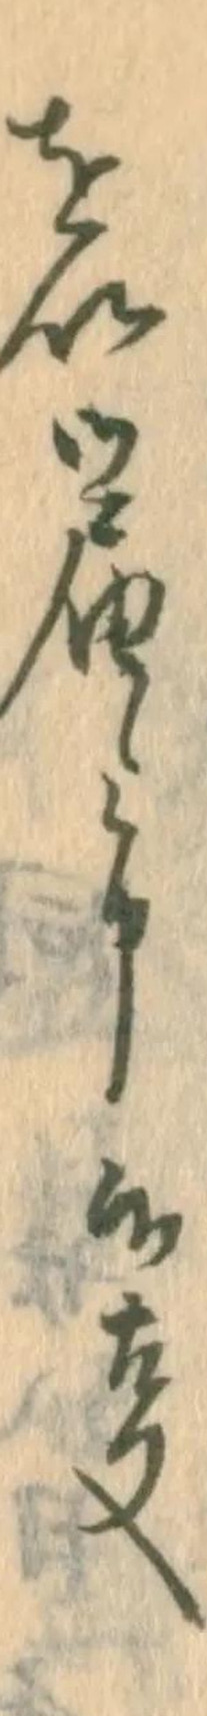を以御届被申候事
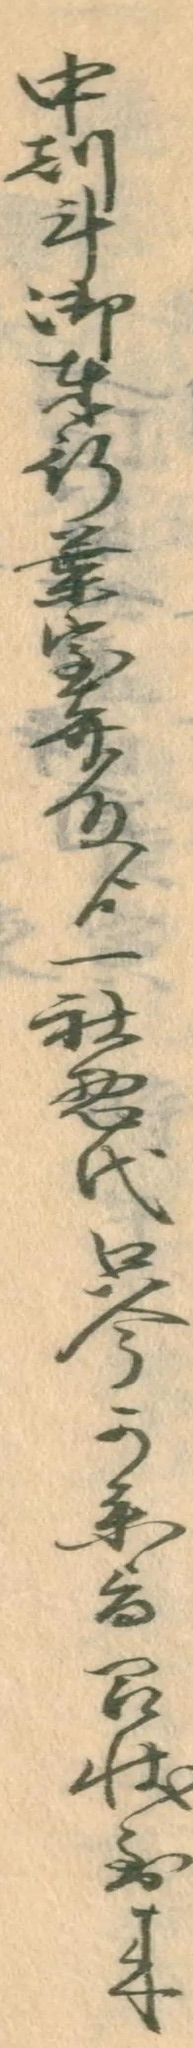一申刻計御奉行葉宝弁殿ゟ一社惣代只今可参旨召状到来
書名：賀茂社記録. 第17冊
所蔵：国立国会図書館 National Diet Library, JAPAN
